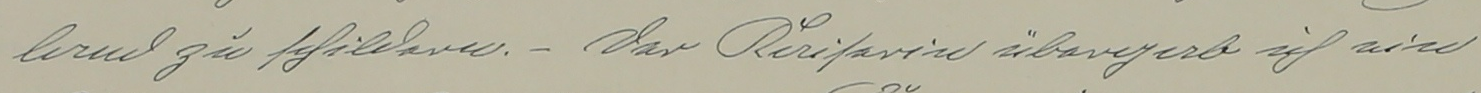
land zu schildern. – Der Kaiserin übergab ich ein
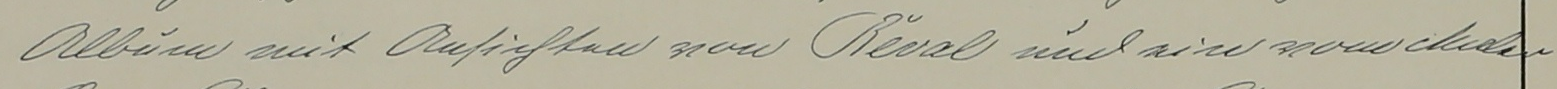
Album mit Ansichten von Reval und ein vom Maler
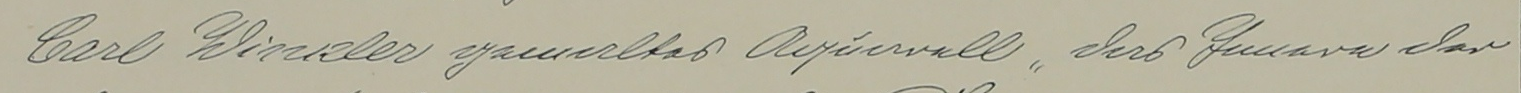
Carl Winkler gemaltes Aquarell „das Innere der
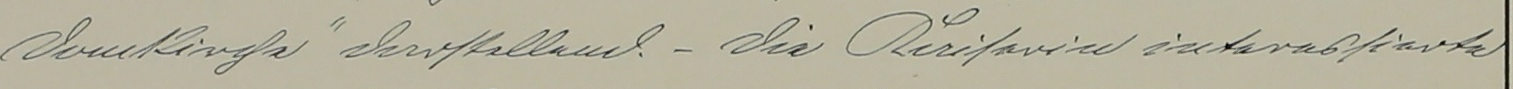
Domkirche“ darstellend. - Die Kaiserin interessierte
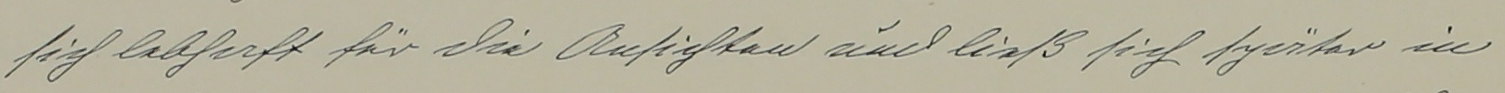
sich lebhaft für die Ansichten und ließ sich später in
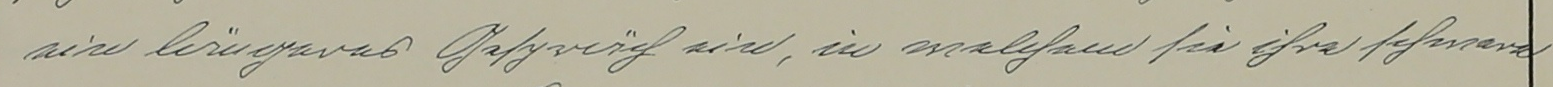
ein längeres Gespräch ein, in welchem sie ihre schwere
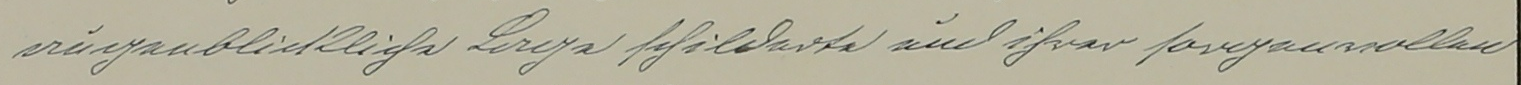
augenblickliche Lage schilderte und ihrer sorgenvollen
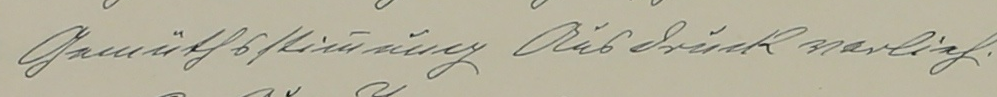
Gemüthsstimmung Ausdruck verlieh.
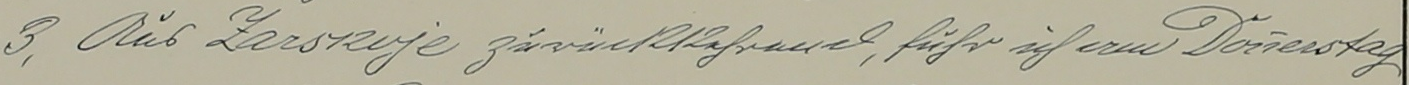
3. Aus Zarskoje zurückkehrend, fuhr ich am Donnerstag
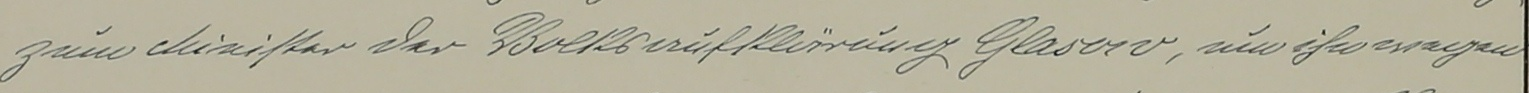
zum Minister der Volksaufklärung Glasow, um ihn wegen
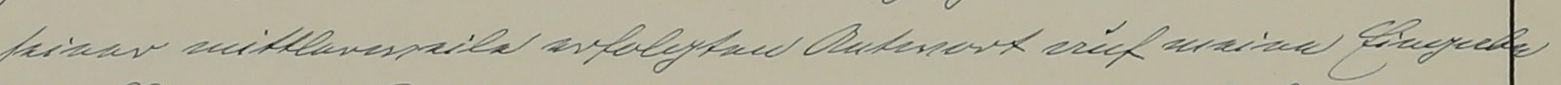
seiner mittlerweile erfolgten Antwort auf meine Eingabe
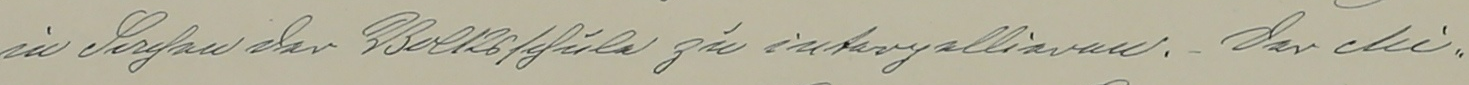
in Sachen der Volksschule zu interpellieren. - Der Mi-
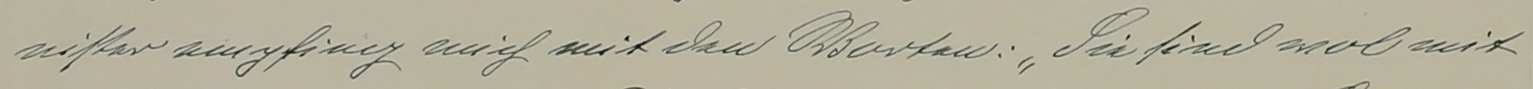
nister empfing mich mit den Worten: „Sie sind wol mit
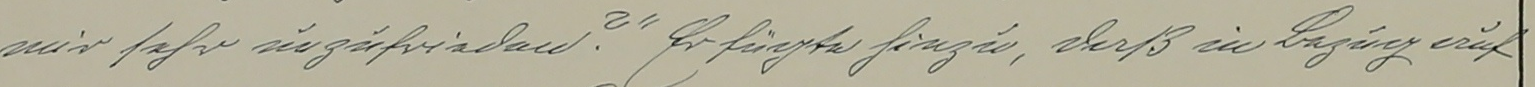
mir sehr unzufrieden?“ Er fügte hinzu, daß in Bezug auf
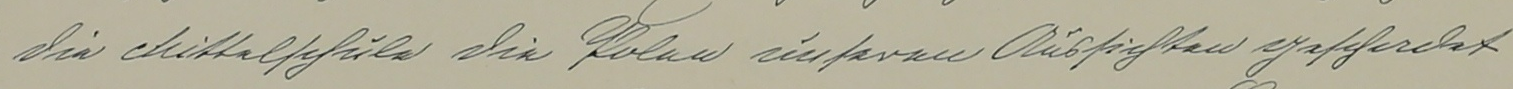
die Mittelschule die Polen unseren Aussichten geschadet
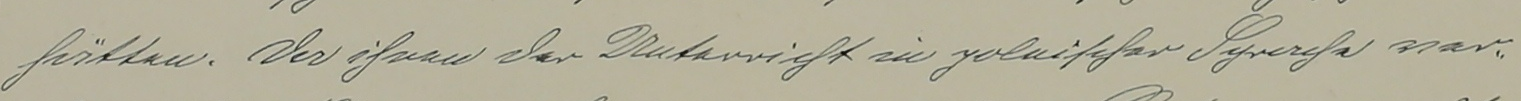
hätten. Da ihnen der Unterricht in polnischer Sprache ver-
